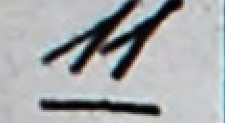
11
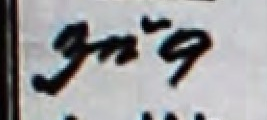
zu 9
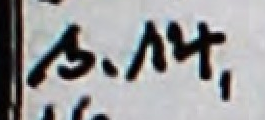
s. 14,
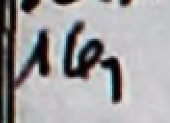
16
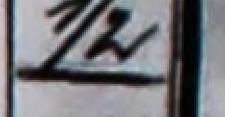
1/2
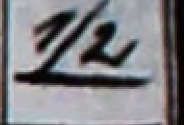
1/2
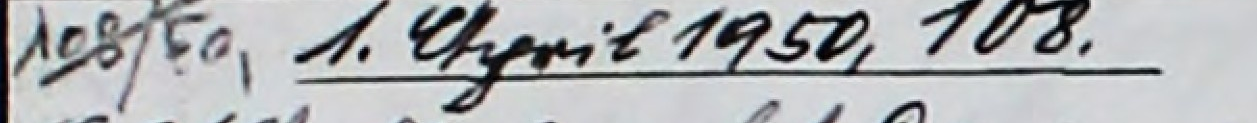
108/50, 1. April 1950, 108.
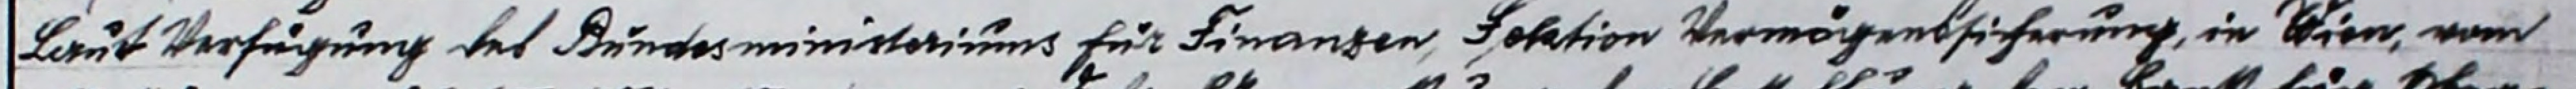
Laut Verfügung des Bundesministeriums für Finanzen, Sektion Vermögenssicherung, in Wien, vom
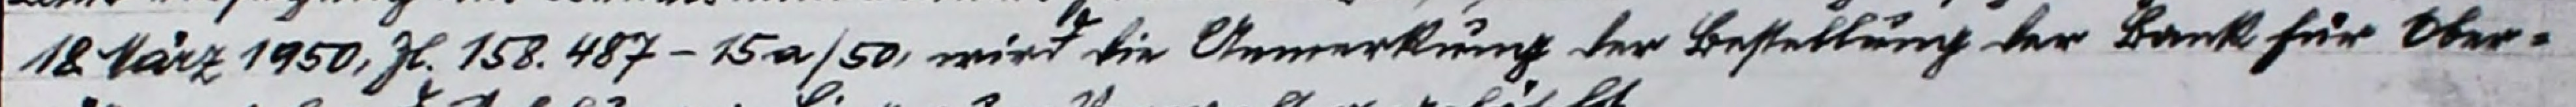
18 März 1950, Zl. 158. 487 - 15a/50, wird die Anmerkung der Bestellung der Bank für Ober=
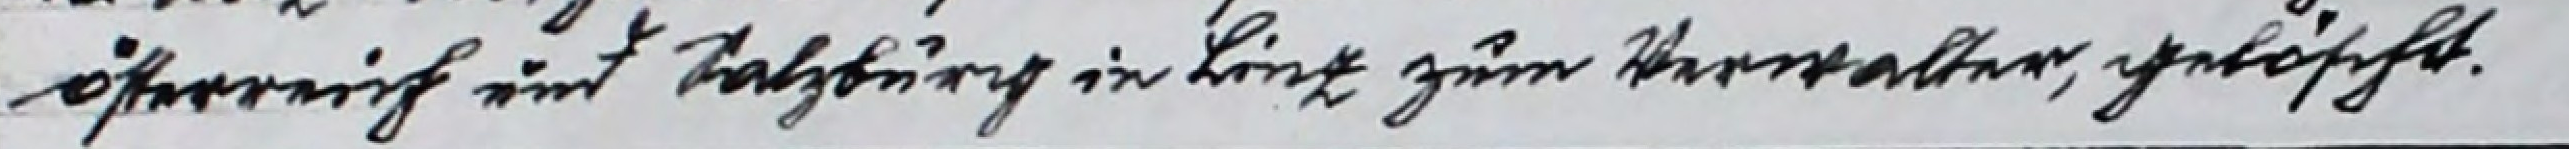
österreich und Salzburg in Linz zum Verwalter, gelöscht.
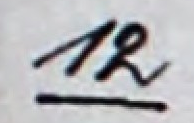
12
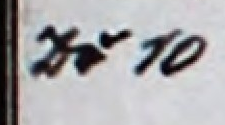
zu 10
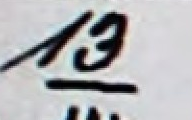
13
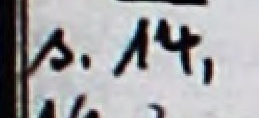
s. 14,
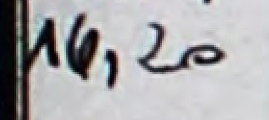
16, 20
